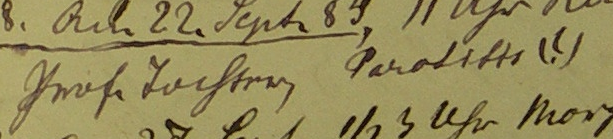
Prof. Tochter Peritoritis
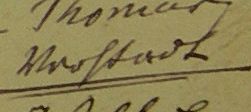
Vorstadt
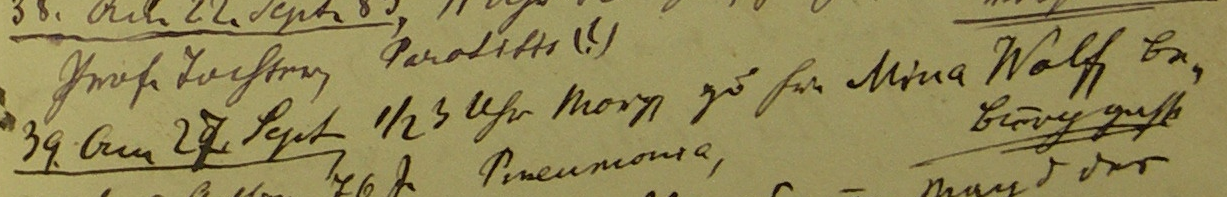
39. Am 27. Sept., 83, ½ 3 Uhr Morg. Zu Fr. Mina Wolf, be¬
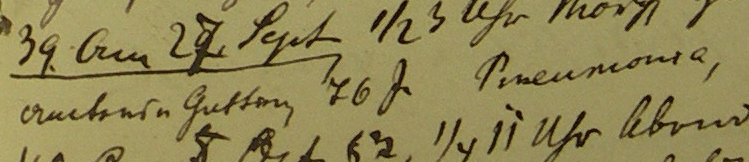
amten Gattin, 76 J. Pneumonia
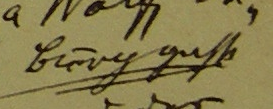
Burggasse
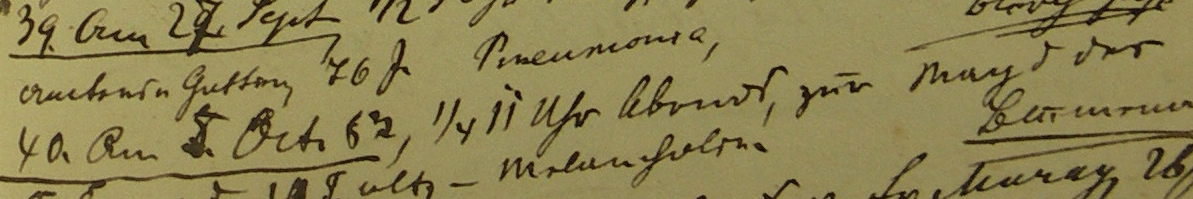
40. Am 5. Okt., 83, 17$ 11 Uhr Abends, zur Magd des
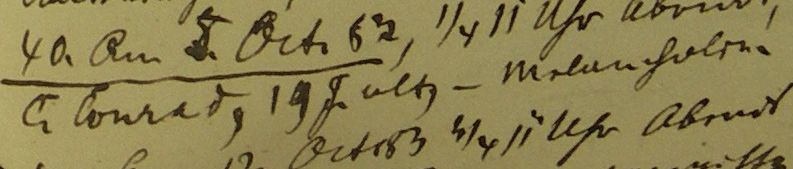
Z. Conrad, 19 J. alt Melancholie
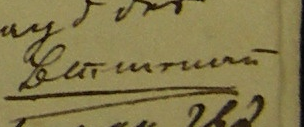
Blumenau
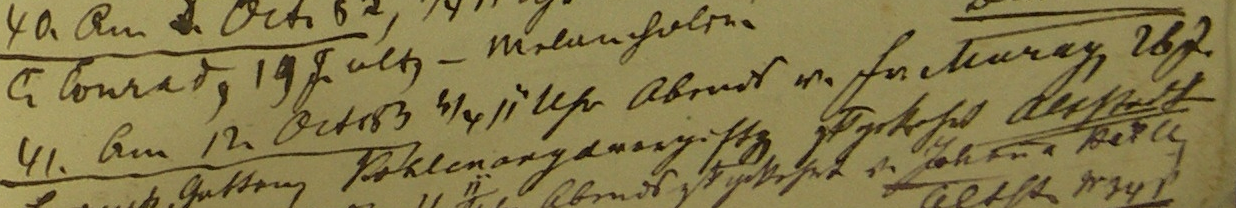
41. Am 12. Okt. 83, ¾ 11 Uhr, Abends, zu Fr. Murag , 26 J.
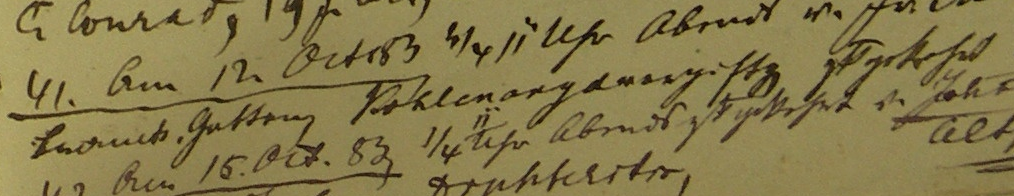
Beamt. Gattin Kohlenorganangriff, zusammengekehrt
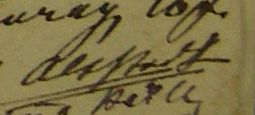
Altstadt
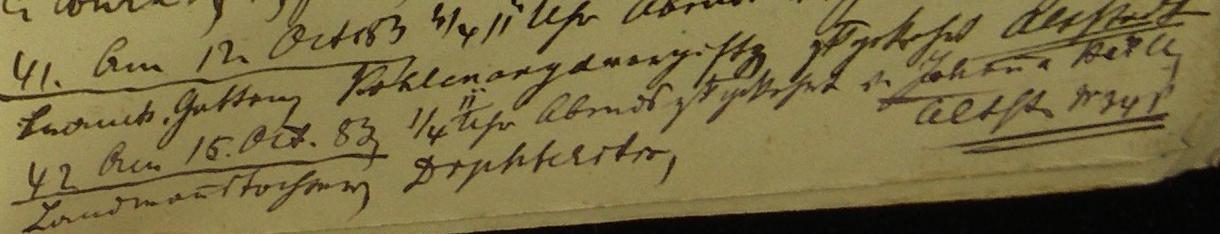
42. Am 15. Okt., 83, ¼ 11 Uhr Abends, zusammengekehrt, Johanna Kelly,
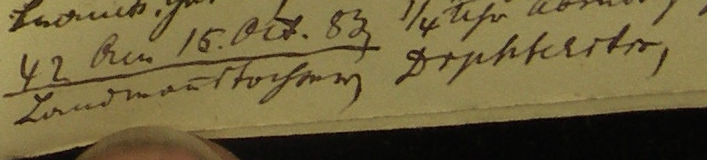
Landmannstochter Diphteritis
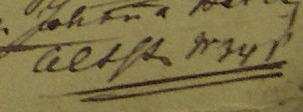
Altstadt Nr. 341
